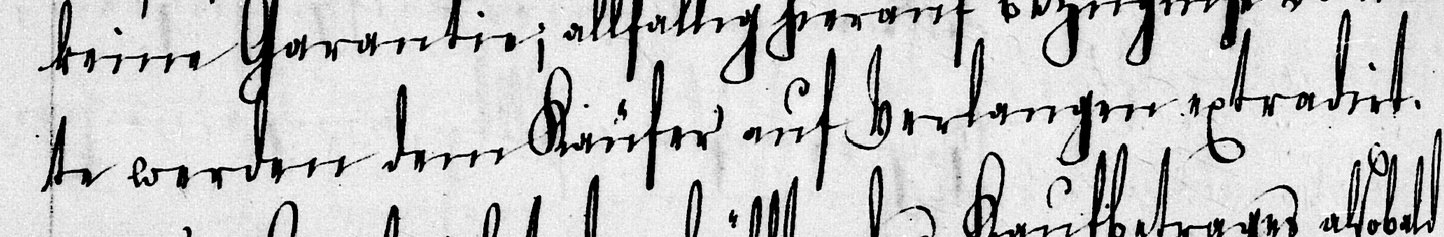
nte werden dem Käufer auf Verlangen extradirt.
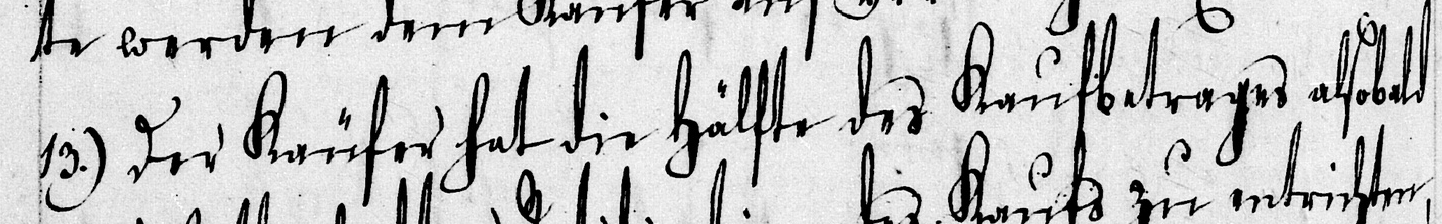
13.) Der Käufer hat die Hälfte des Kaufbetrages also¬
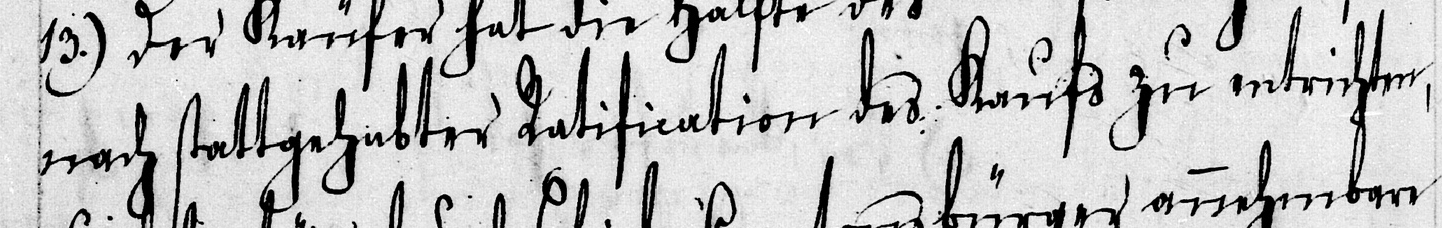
nach stattgehabter Ratification des Kaufs zu entrichte¬
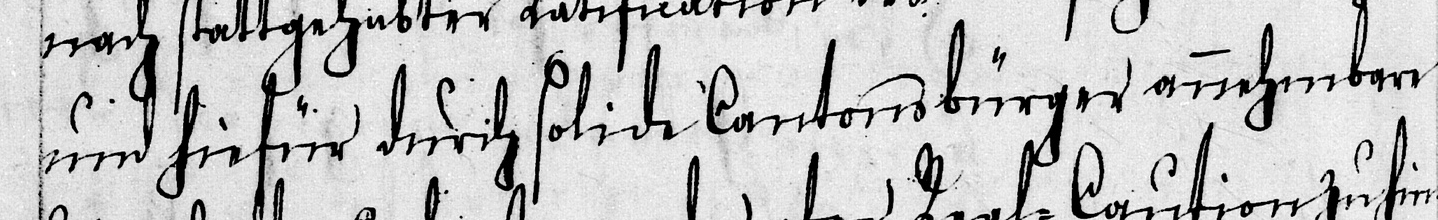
und hiefür durch solide Cantonsbürger annehmbare
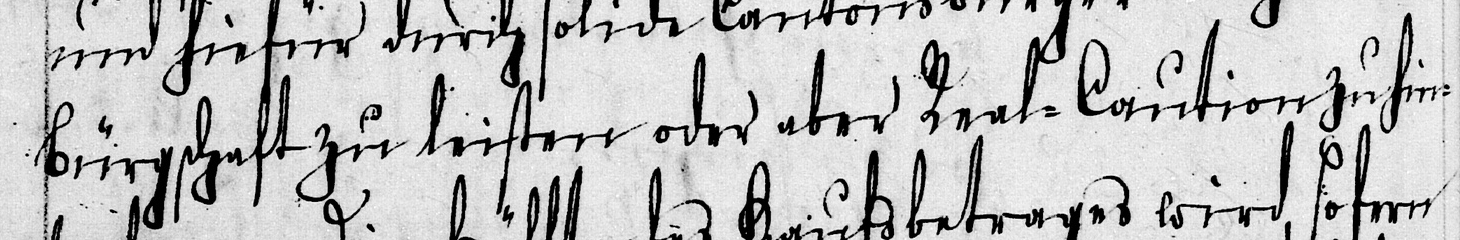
Bürgschaft zu leisten oder aber Real-Caution zu hi¬
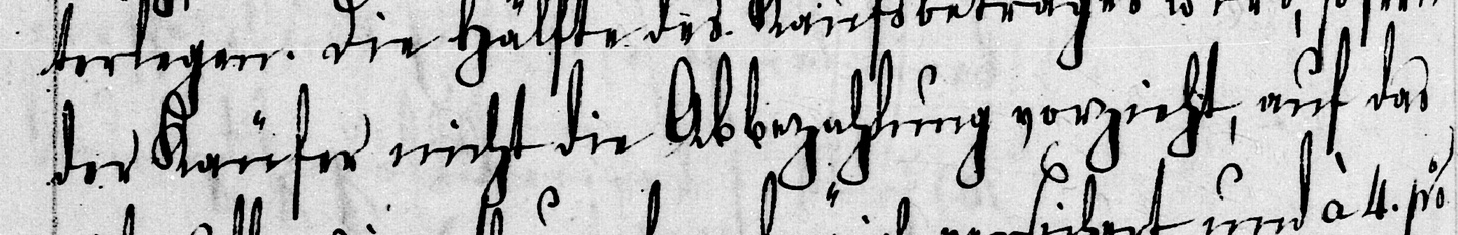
der Käufer nicht die Abbezahlung vorzieht, auf das
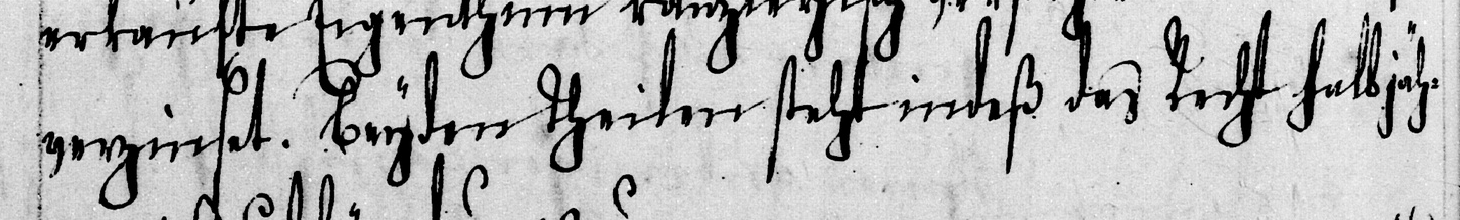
verzinset. Beyden Theilen steht indeß das Recht halbjä¬
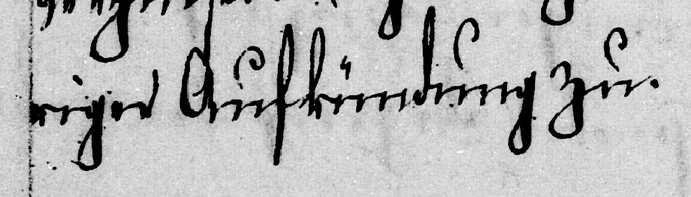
hriger Aufkündung zu.
